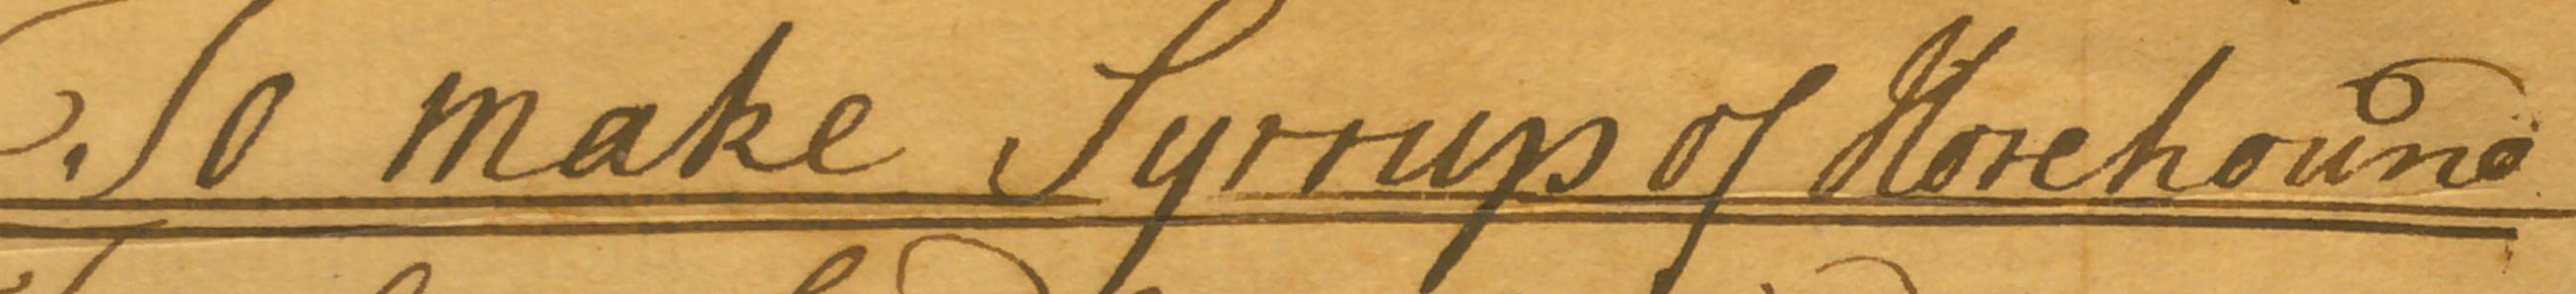To make Syrrup of Horehound
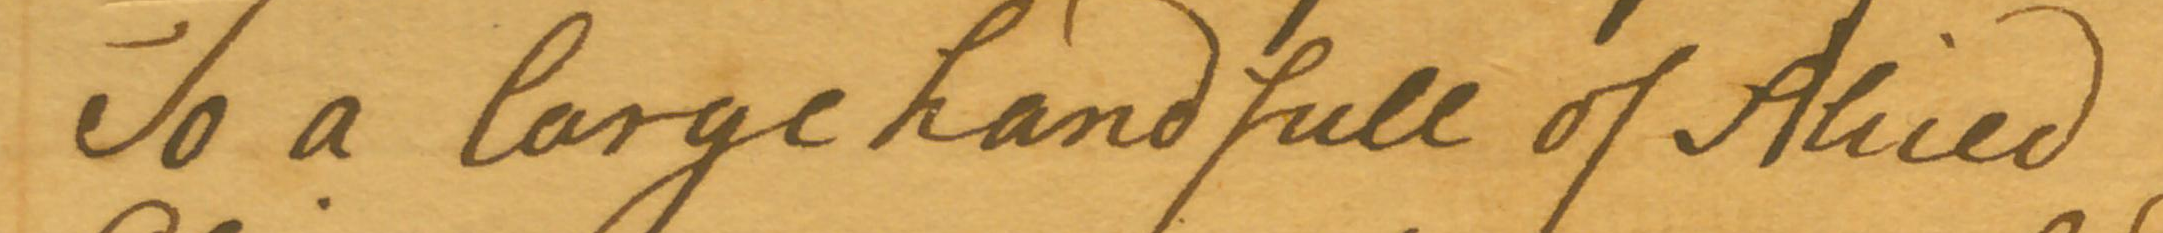To a large handfull of sliced
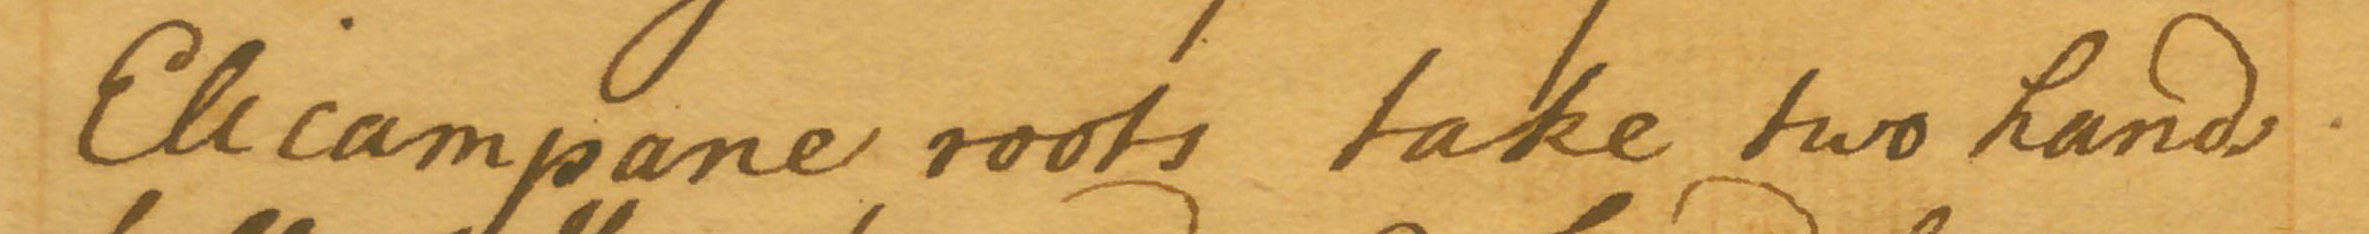Elicampane roots take two hands
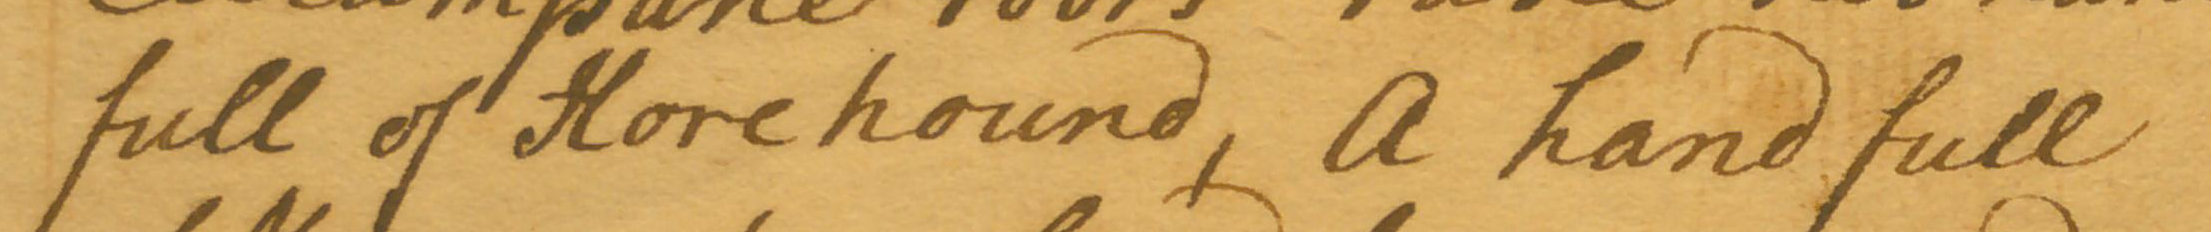full of Horehound, a handfull
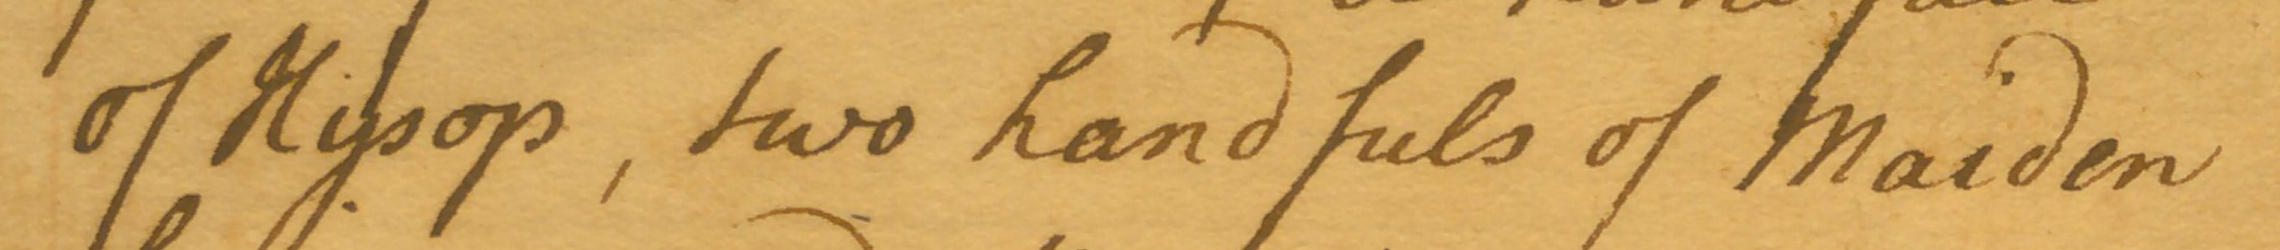of Hysop, two handfuls of Maiden
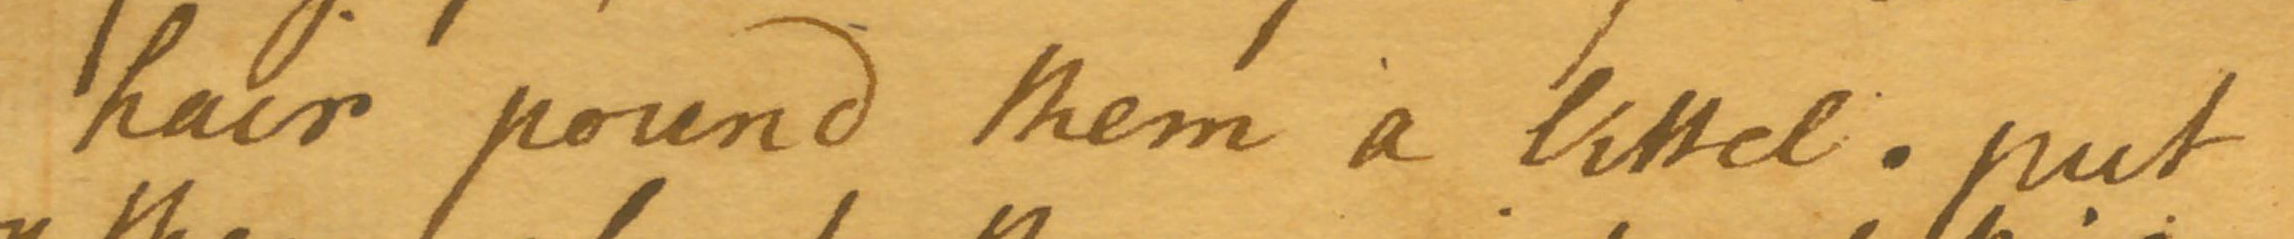hair pound them a littel. put
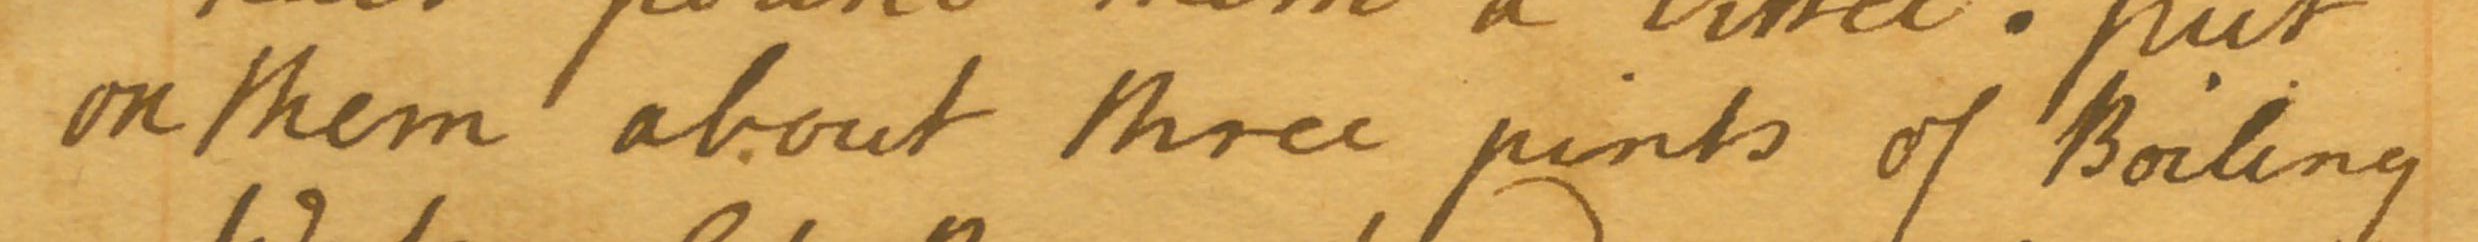on them about three pints of Boiling
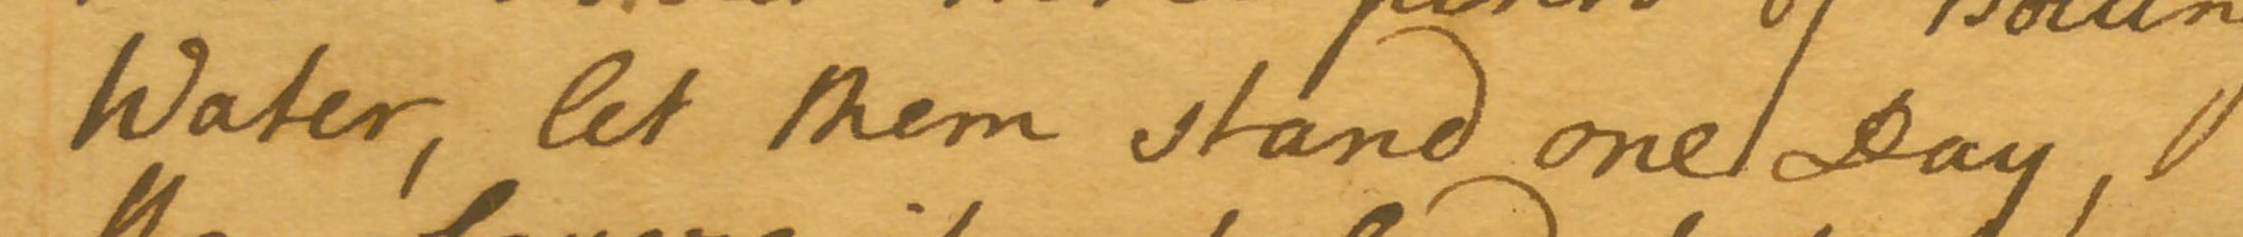Water, let them stand one Day,
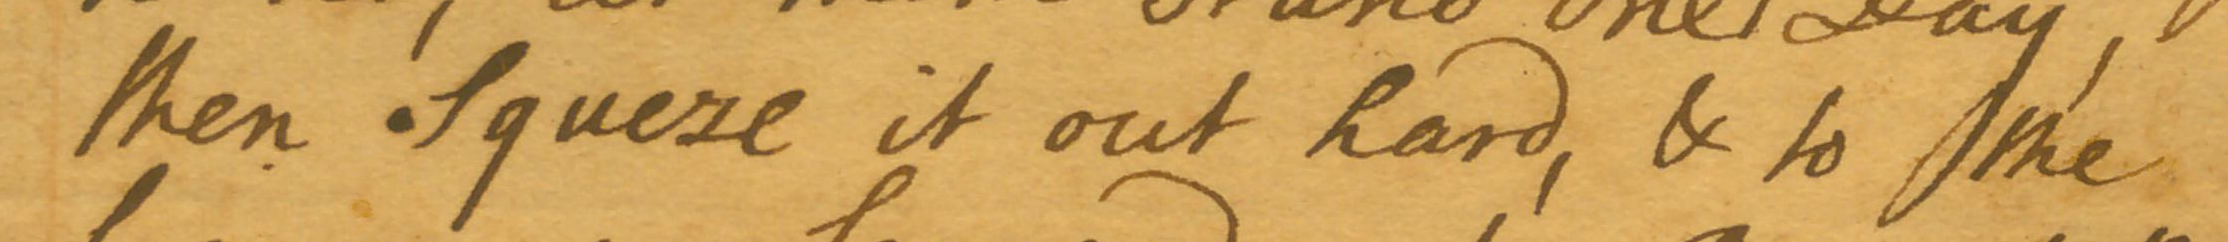then squeeze it out hard, & to the
